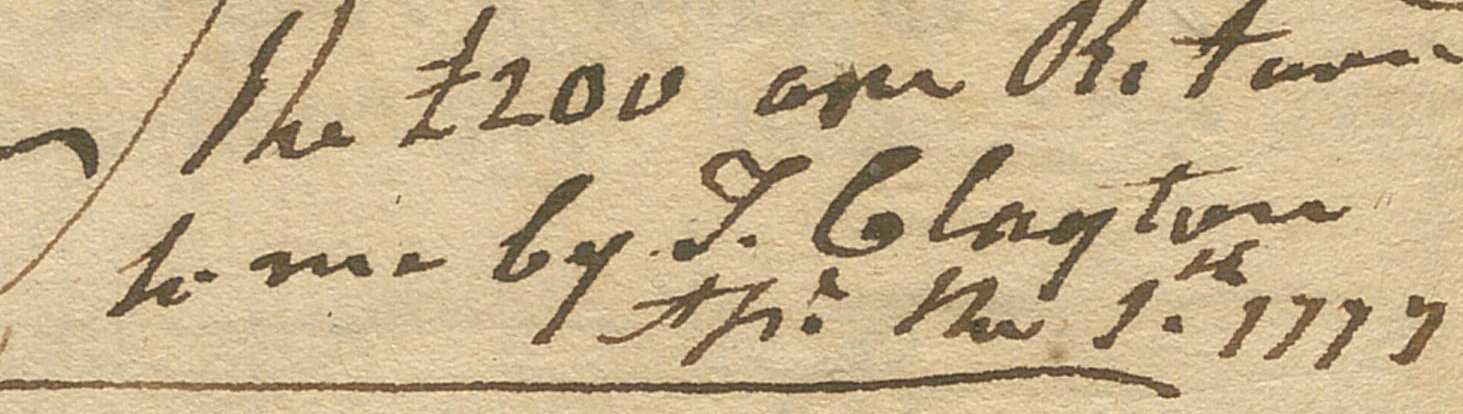to me by T. Clayton
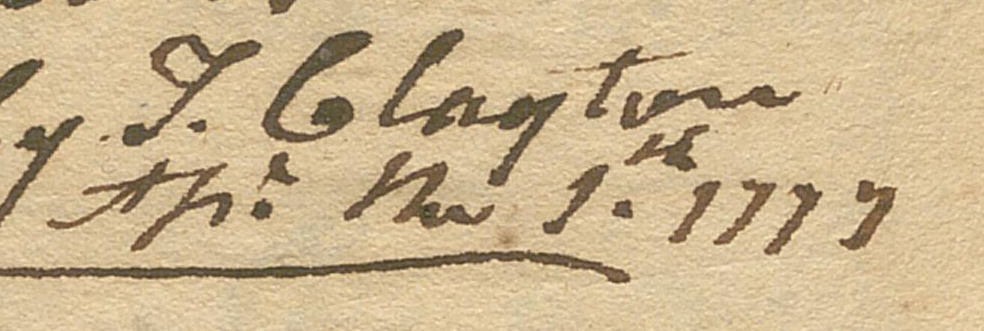Ap^l. the 1^th. 1777
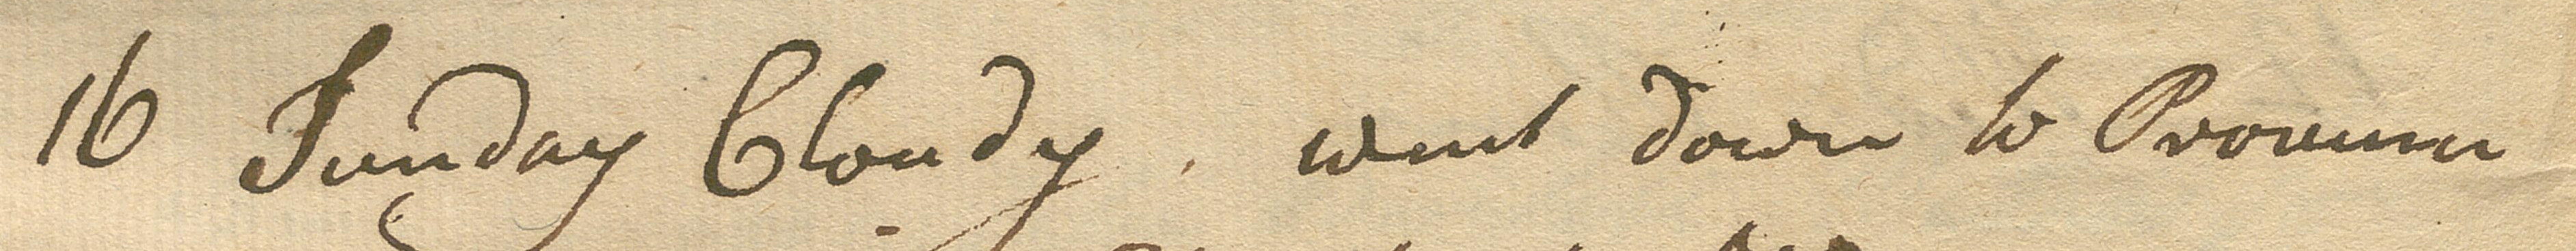16 Sunday Cloudy. went down to Provence
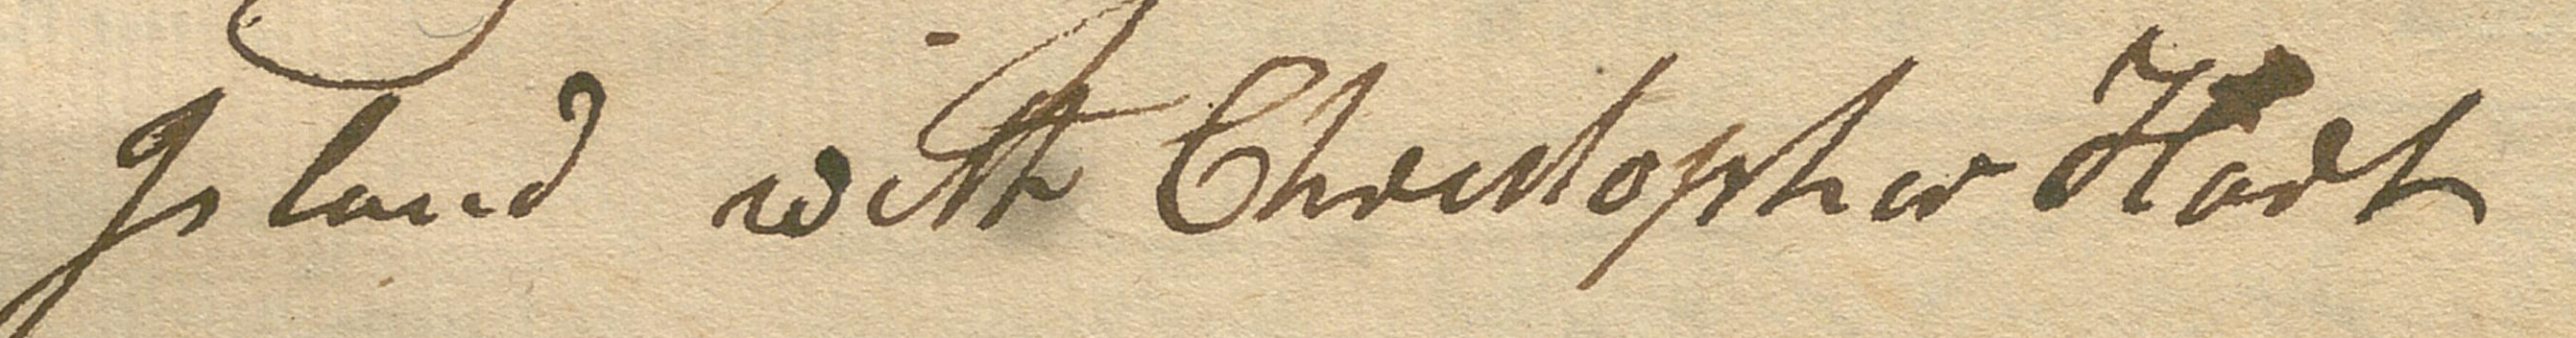Island with Christopher Hart
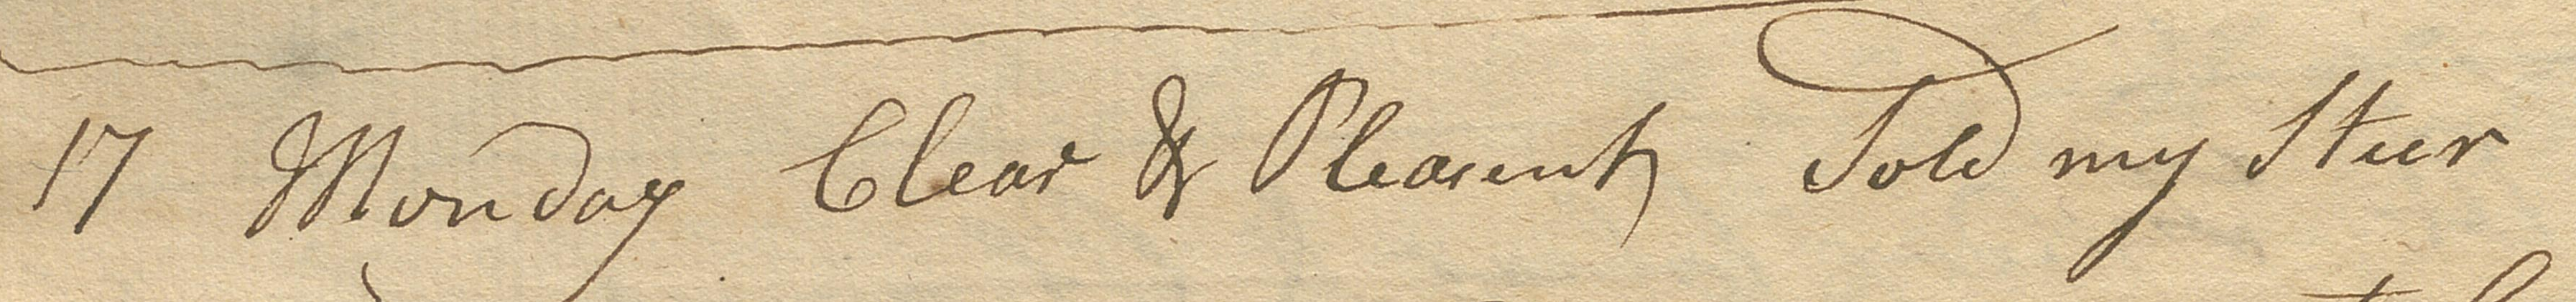17 Monday Clear & Pleasent Sold my Steer
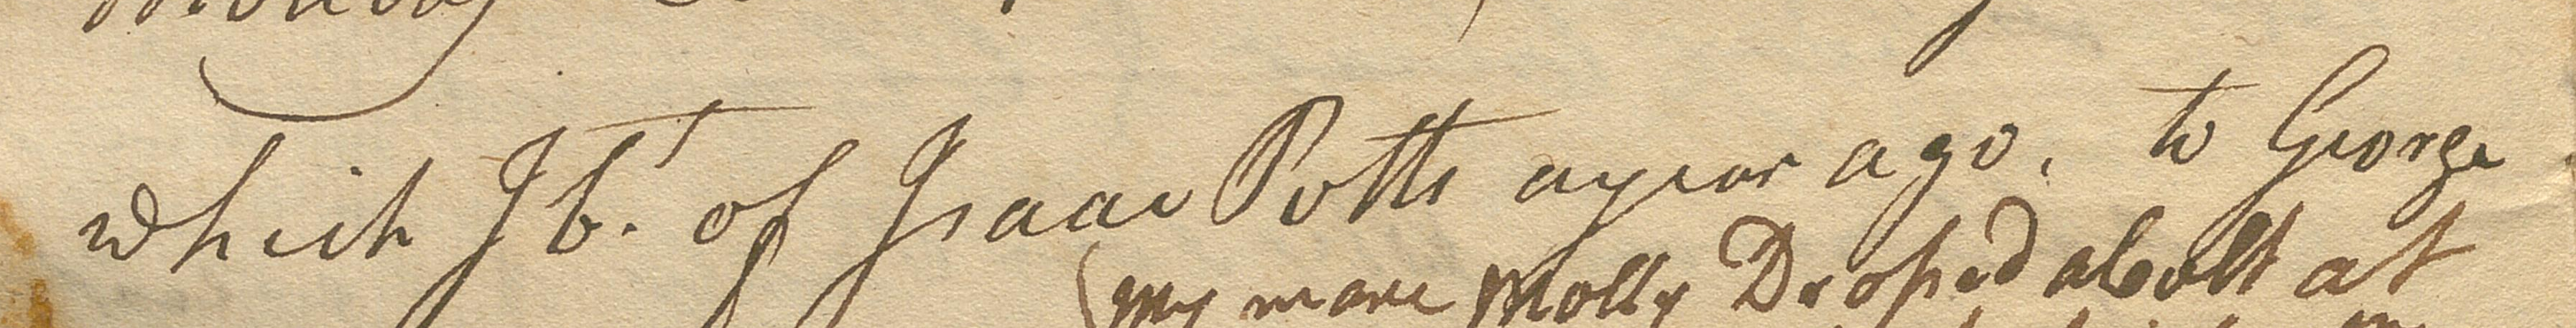which I b^t. of Isaac Potts a year ago. to George
